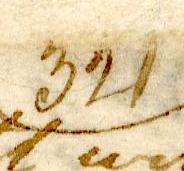321
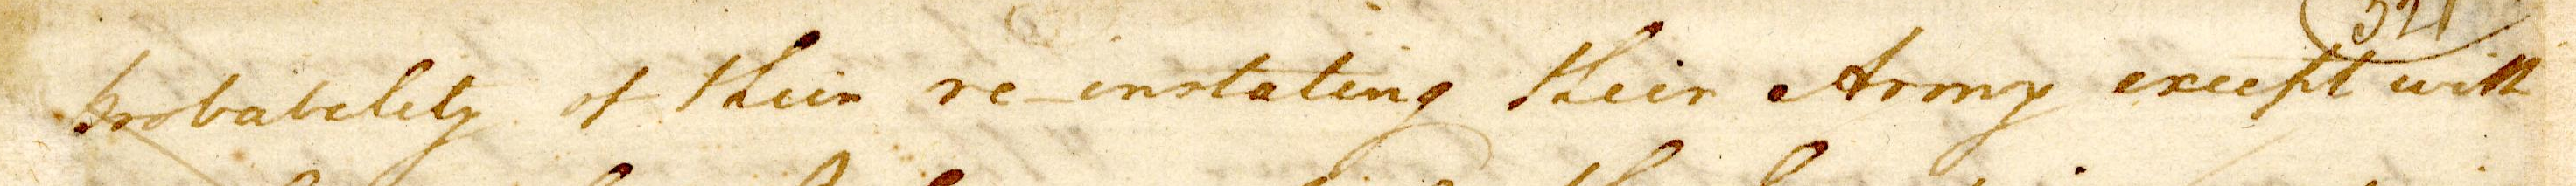Probability of them re-instating their Army except with
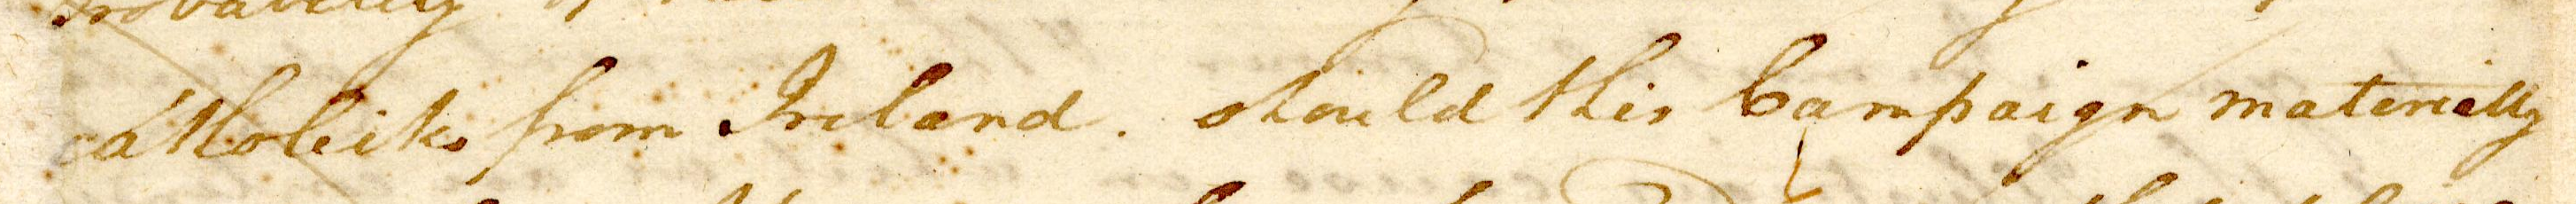catholicks from Ireland. should this Campaign materially
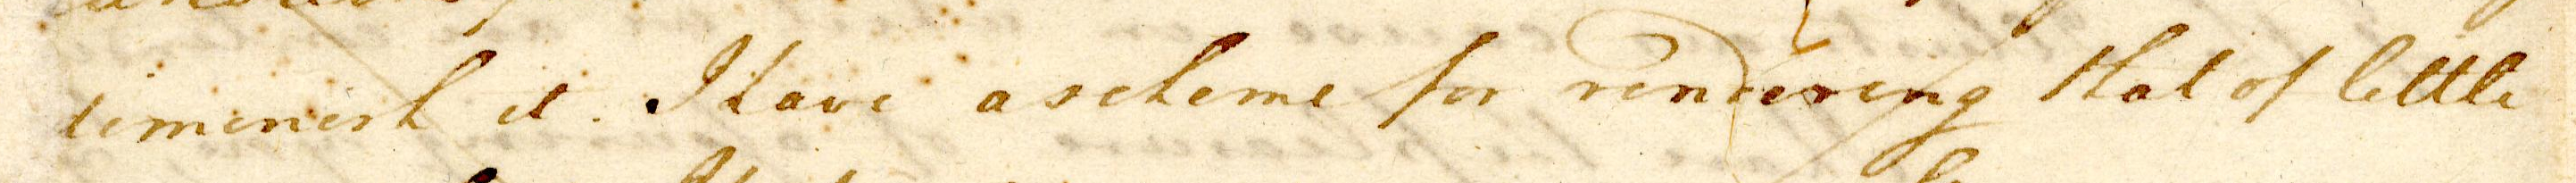diminish it. I have a scheme for rendering that of little
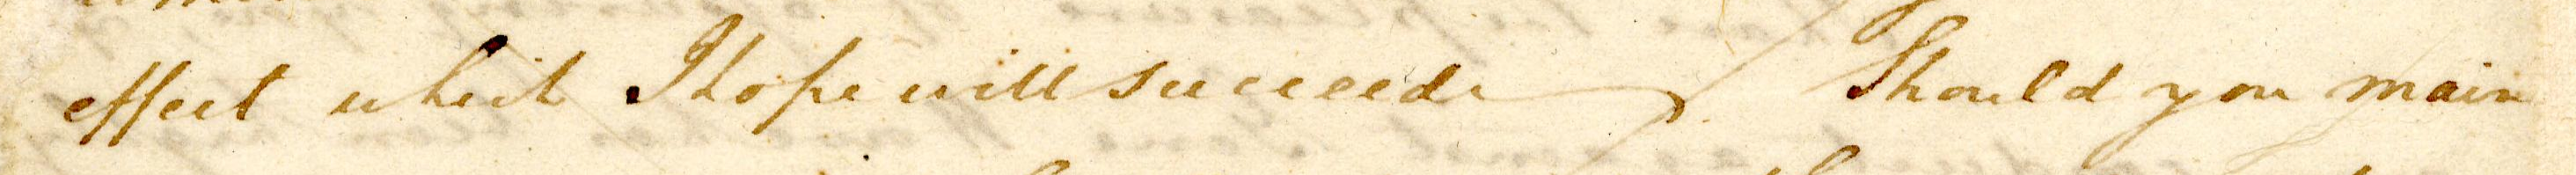effect which I hope will succeed.- Should you main
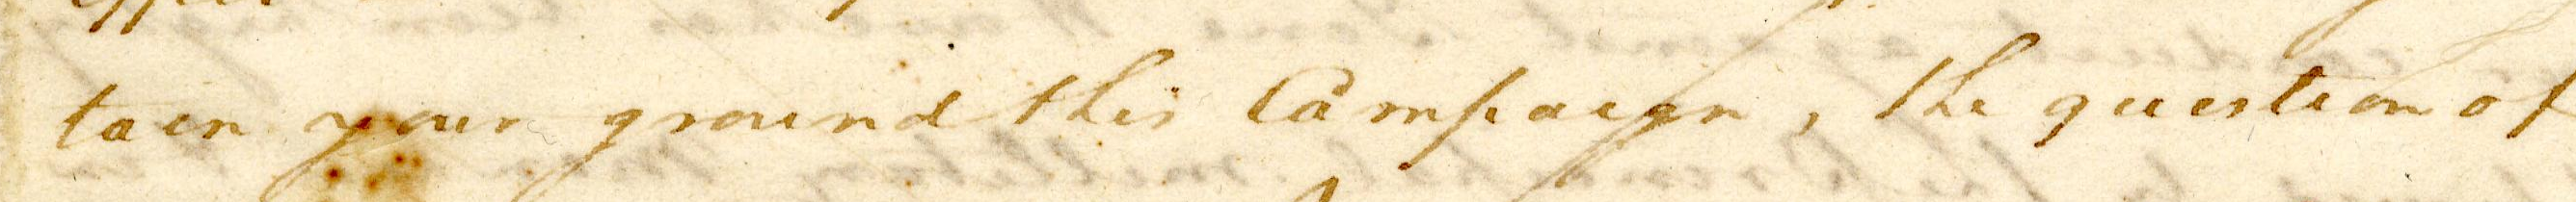tain your ground this Campaign, the question of
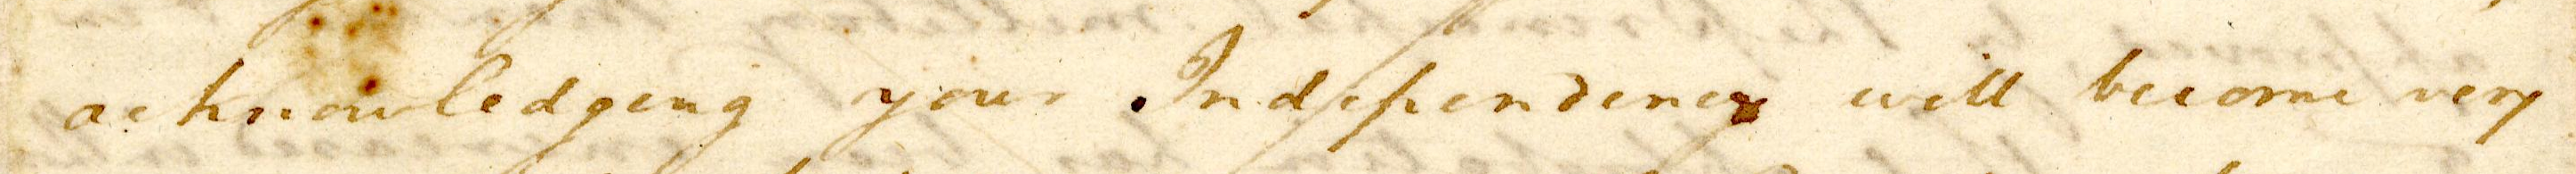acknowledging your Independence will become very
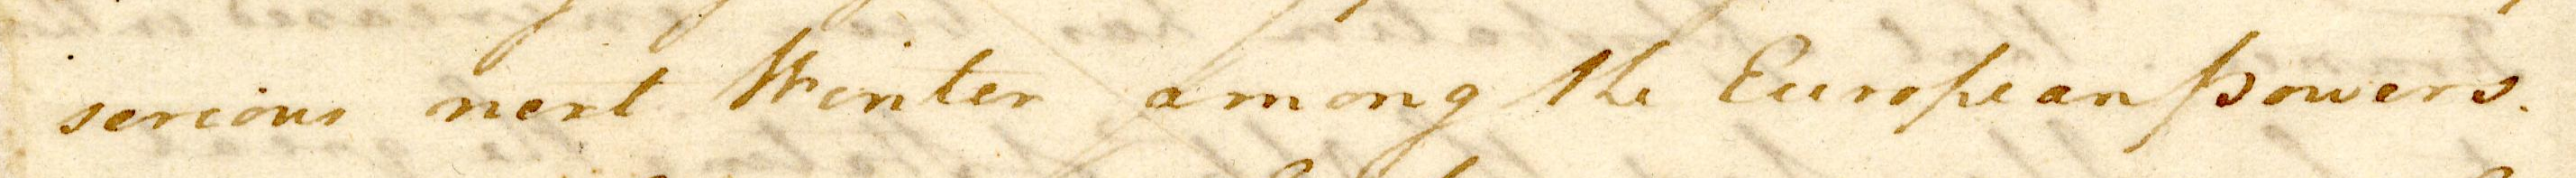serious next Winter among the European powers.
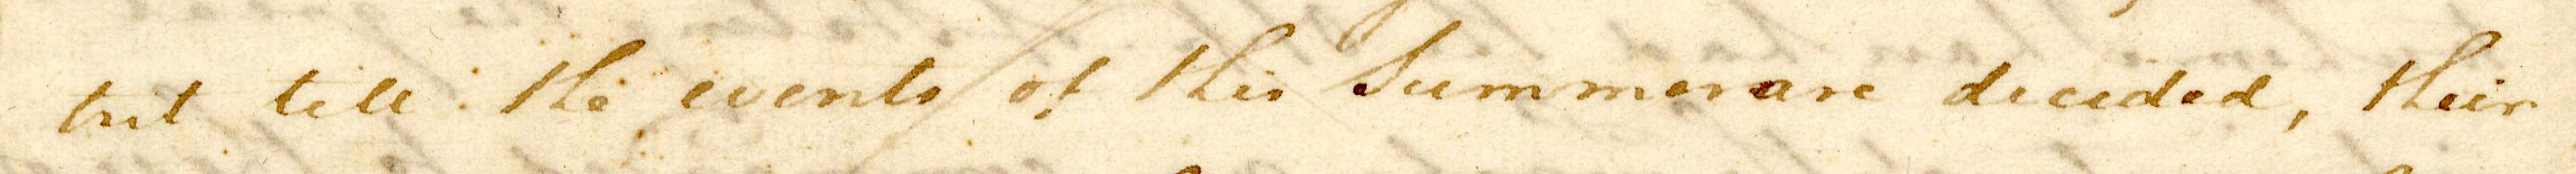but till the events of this Summer are decided, their
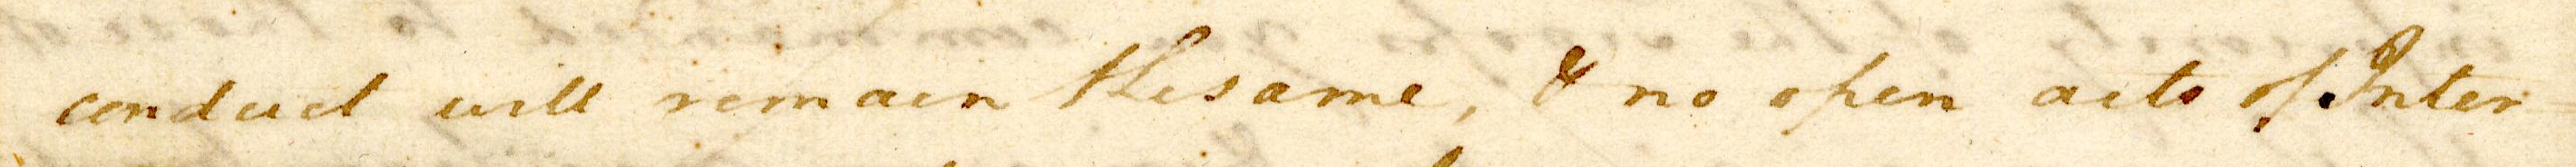conduct will remain the same, & no open acts of Inter
